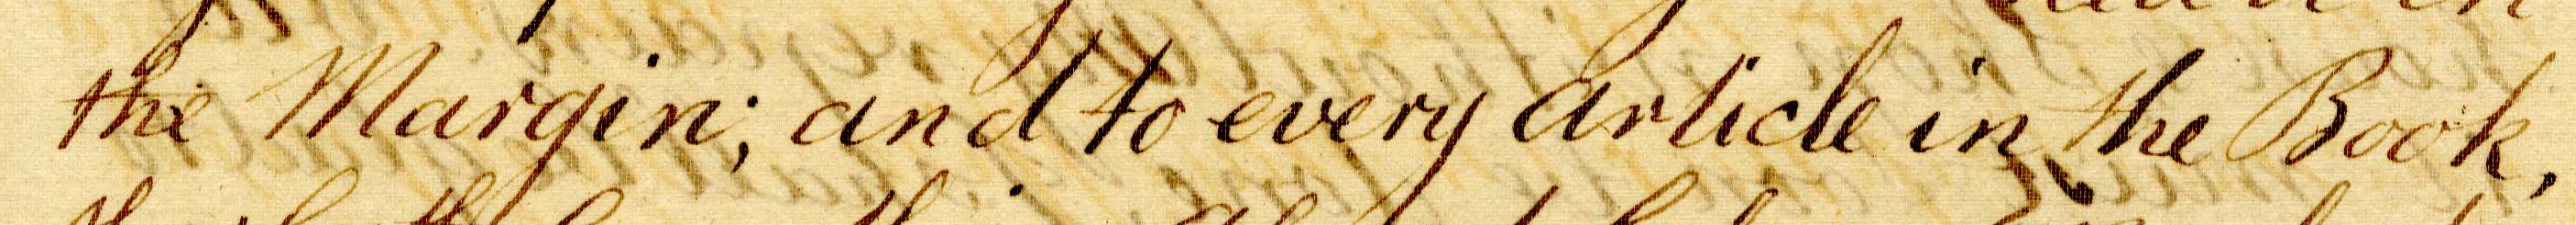the Margin; and to every Article in the Book,
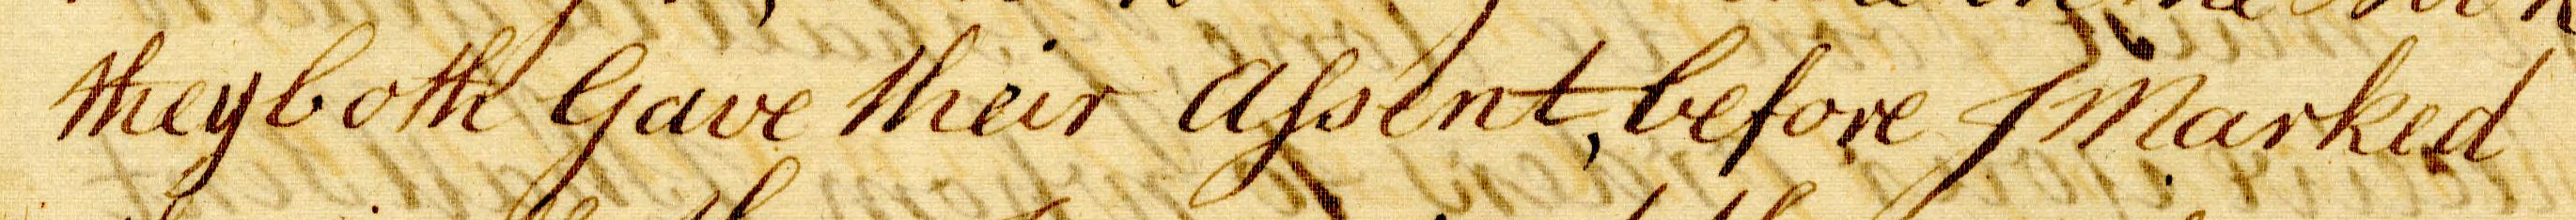they both Gave their Assent, before I Marked
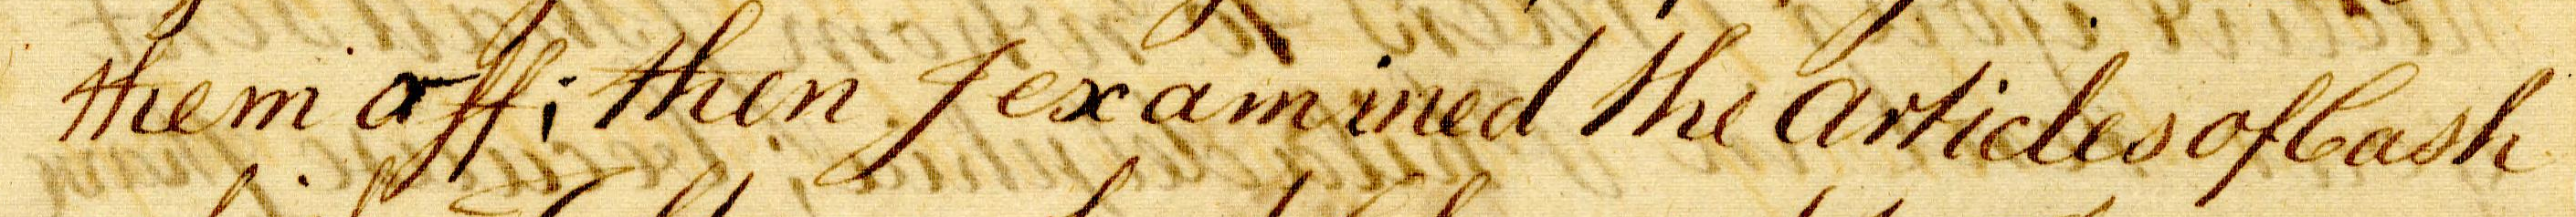them off; then I examined the Articles of Cash
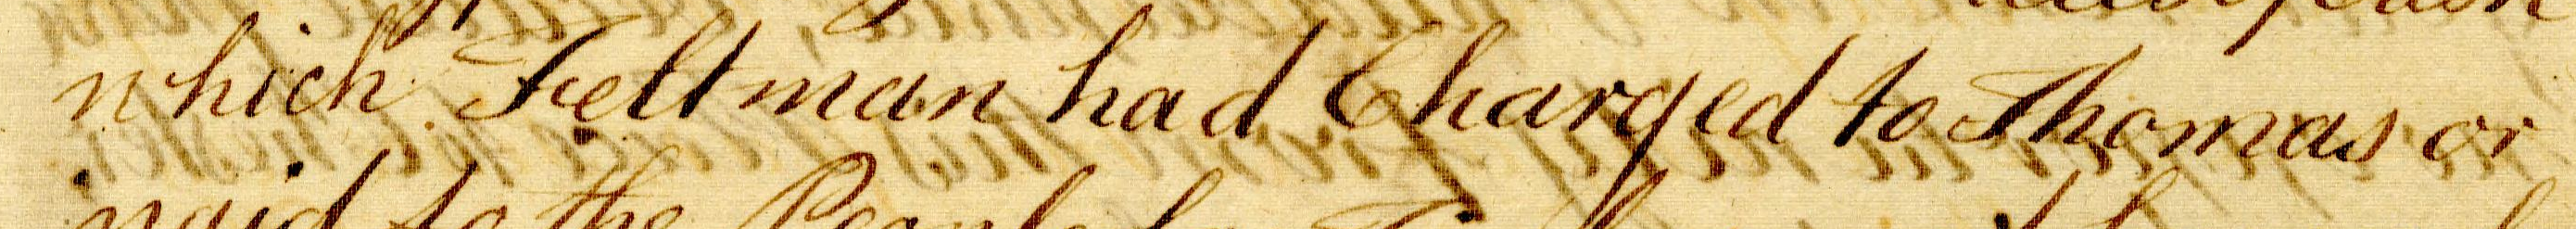which Feltman had Charged to Thomas or
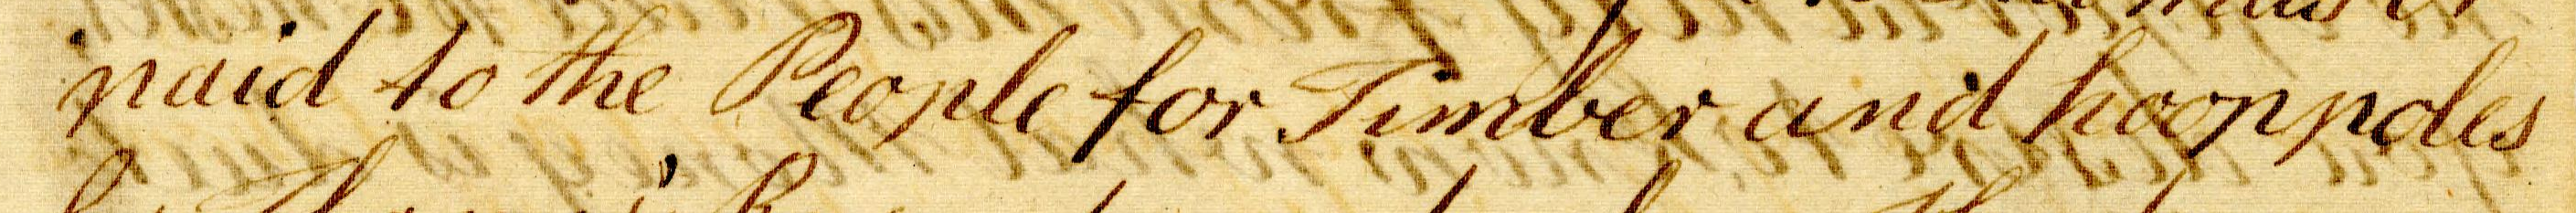paid to the People for Timber and hooppoles
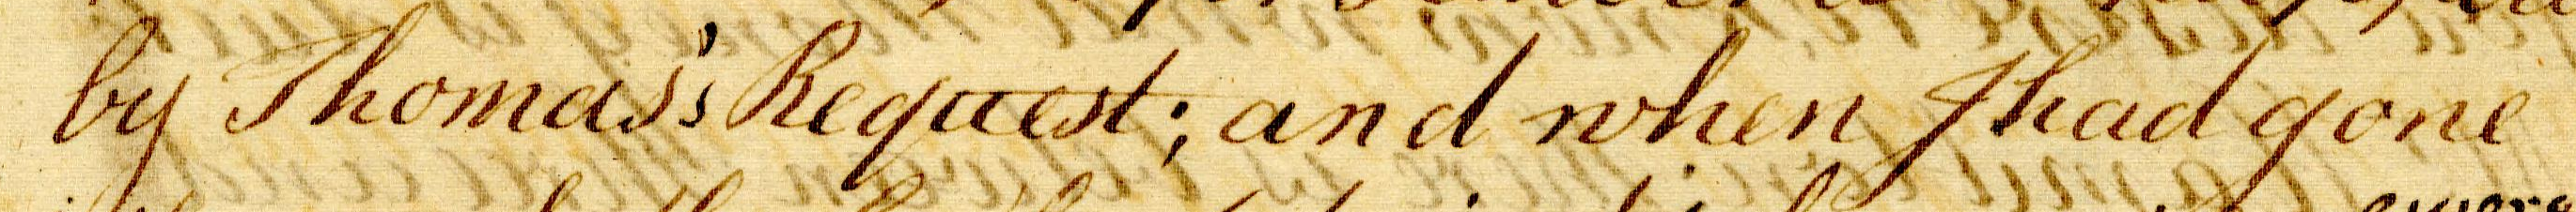by Thomas's Request; and when I had gone
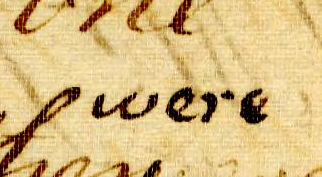were
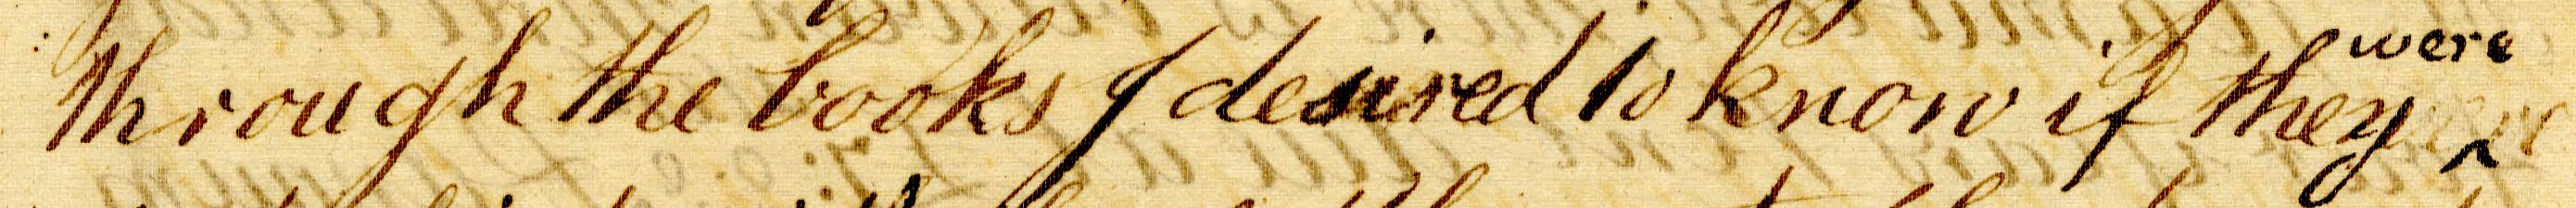through the books I desired to know if they ^
